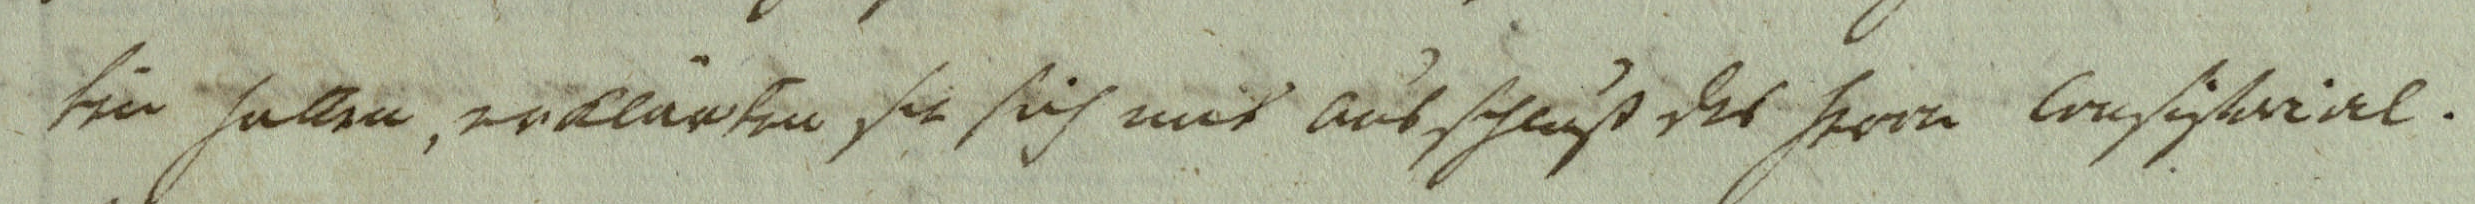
ten hatten, erklärten sie sich mit Ausschluß des Herrn Consistorial¬
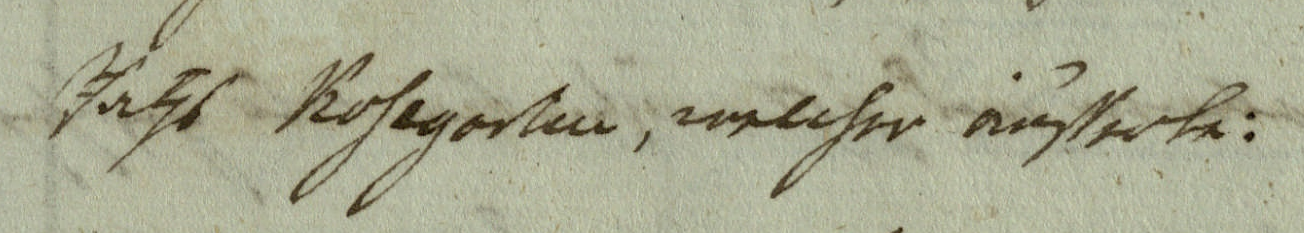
Raths Kosegarten, welcher äusserte:
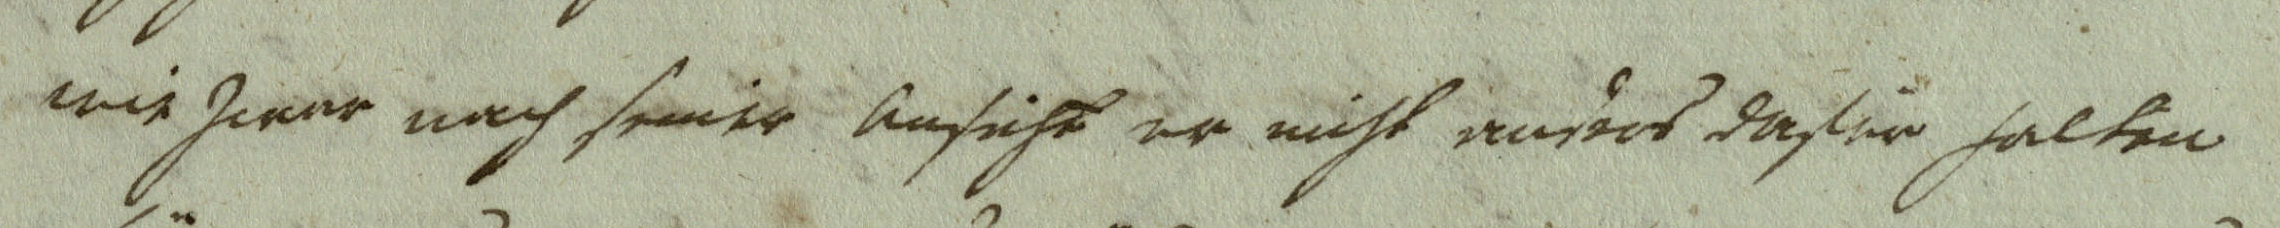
wie zwar nach seiner Ansicht er nicht anders dafür halten
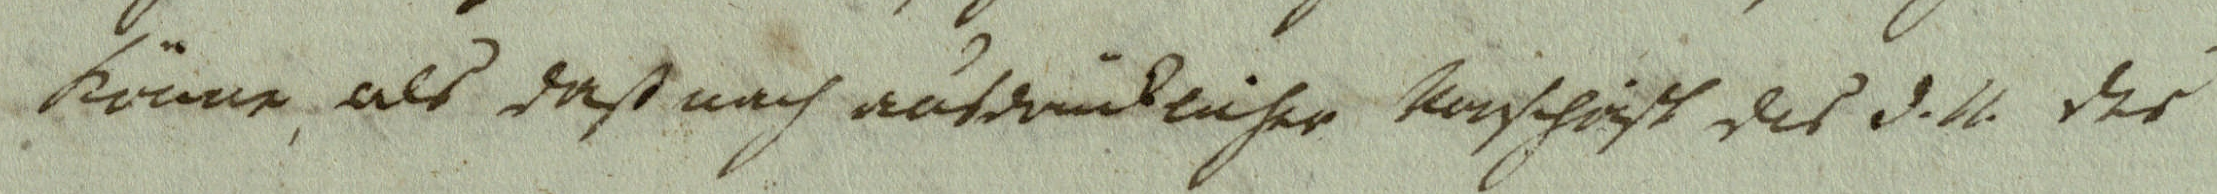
könne, als daß nach ausdrücklicher Vorschrift des §. 11. des
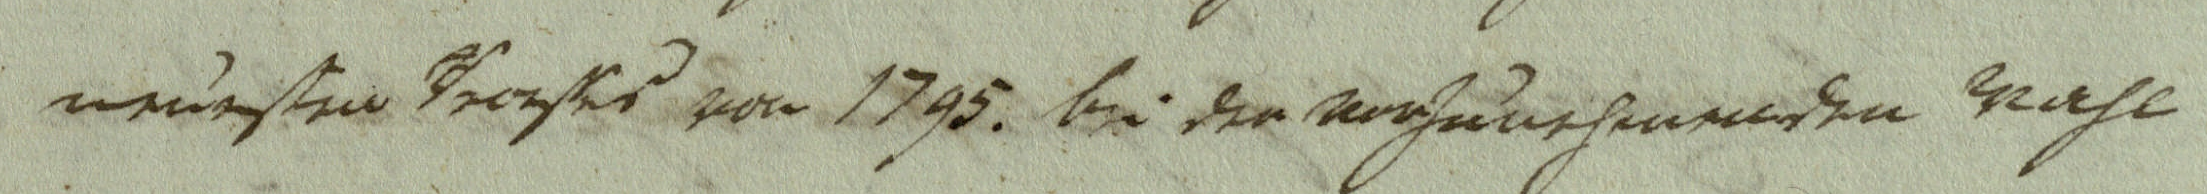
neuesten Recesses von 1795. bei der vorzunehmenden Wahl
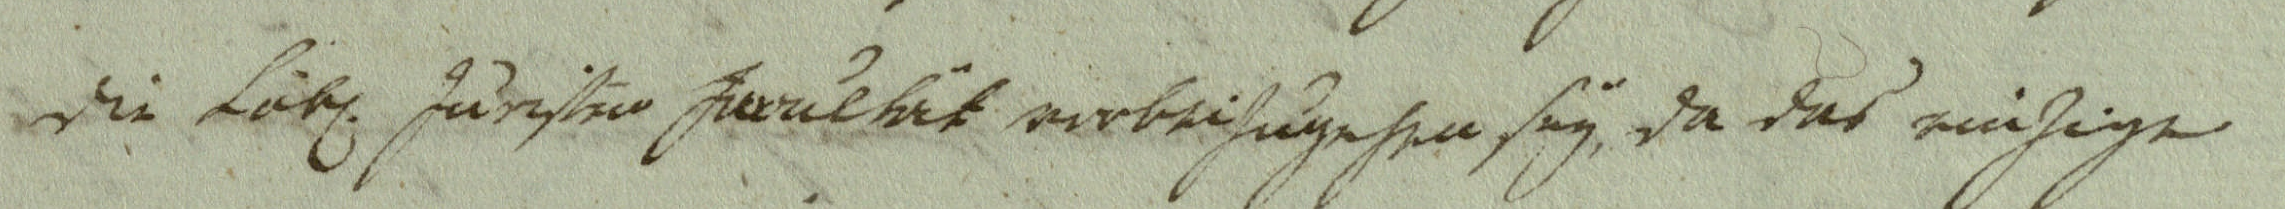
die Löbl. Juristen Facultät vorbeizugehen seÿ, da das einzige
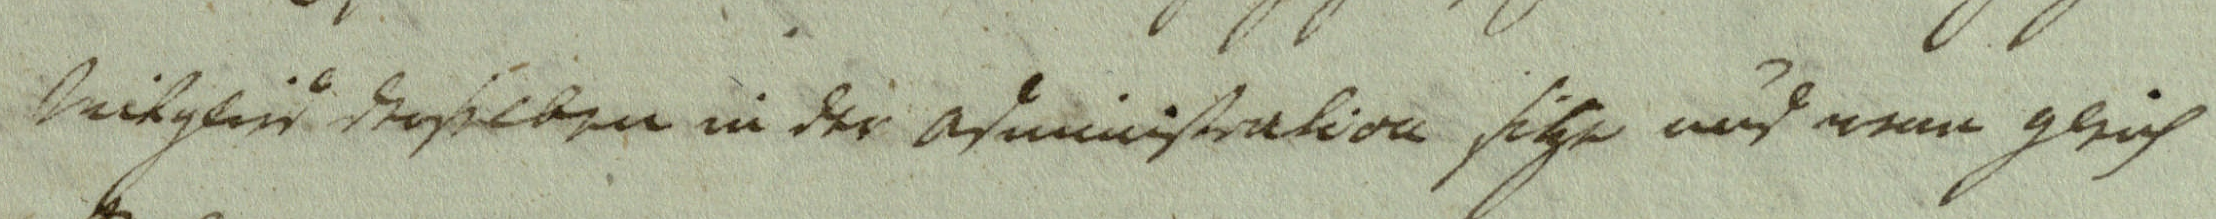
Mitglied derselben in der Administration sitze und wenn gleich
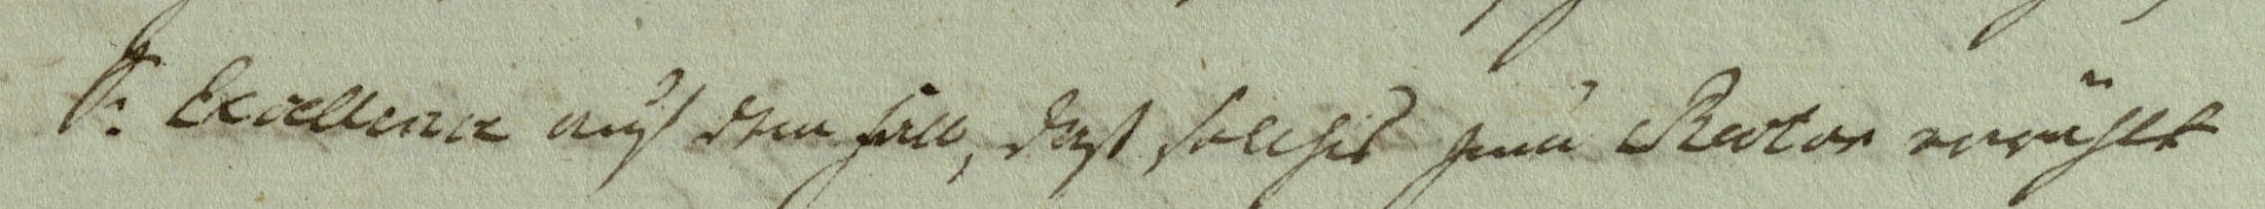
Sr. Excellence auf dem Fall, daß solches zum Rector erwählt
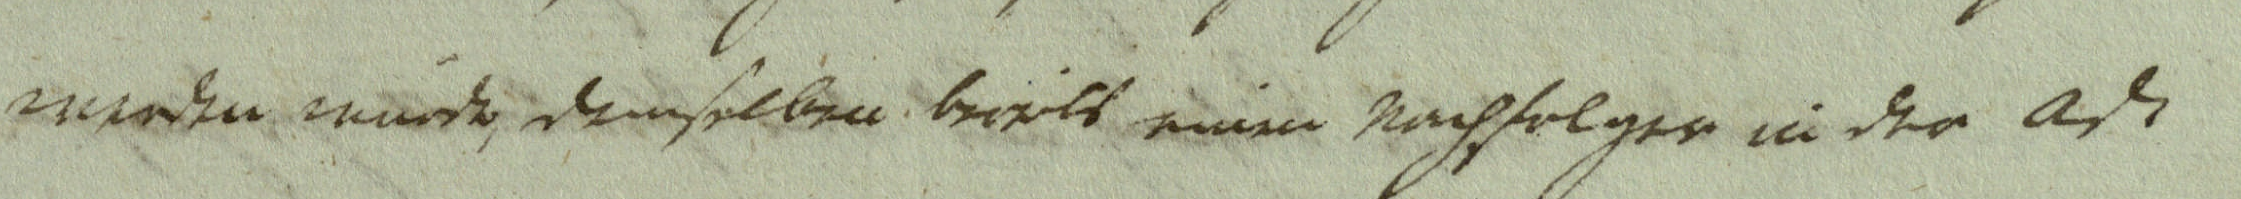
werden würde, demselben bereits einen Nachfolger in der Ad¬
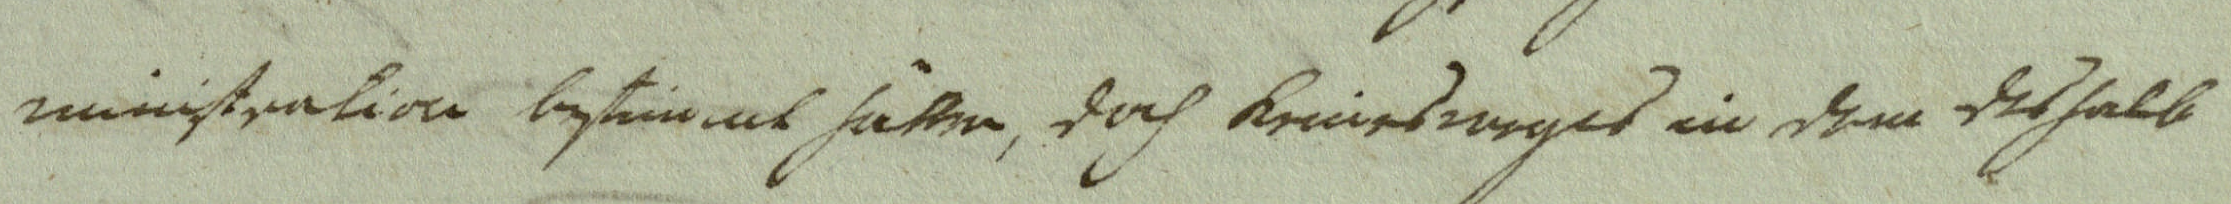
ministration bestimmt hätten, doch keinesweges in dem deshalb
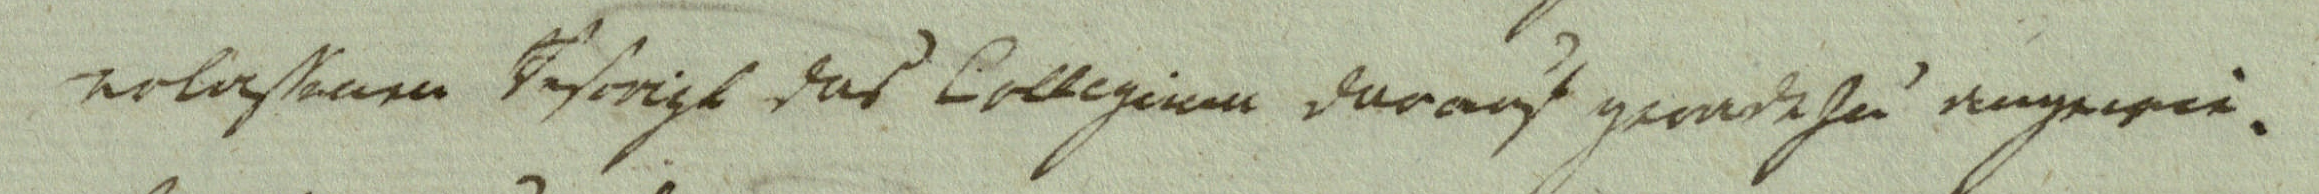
erlassenen Rescript das Collegium darauf geradezu angewie¬
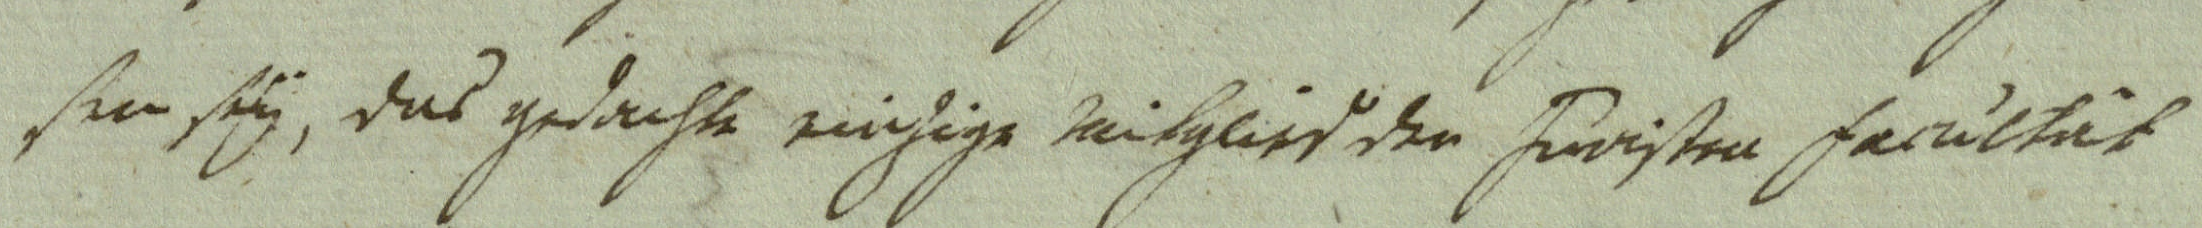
sen seÿ, das gedachte einzige Mitglied der Juristen Facultät
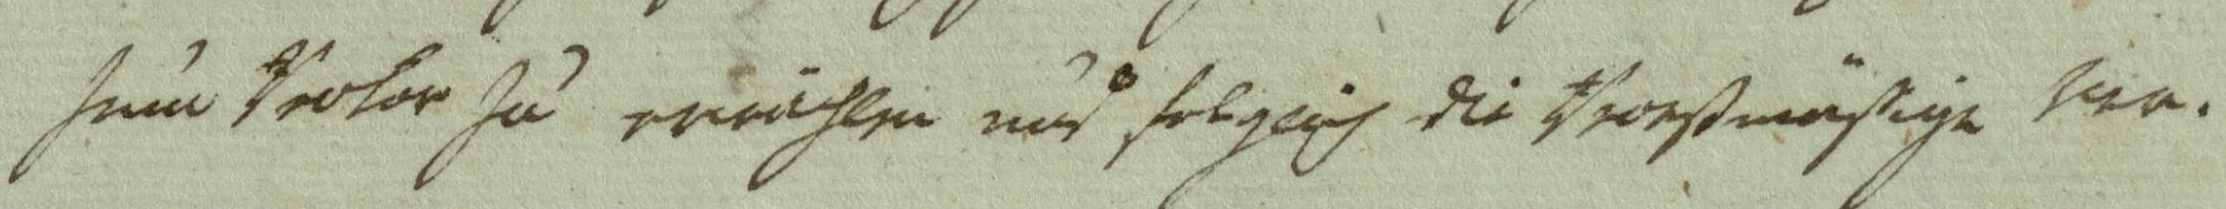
zum Rector zu erwählen und folglich die Receßmässige Ver¬
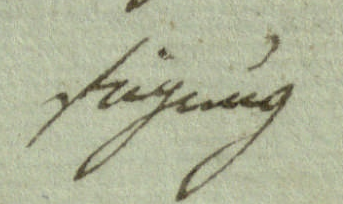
fügung
